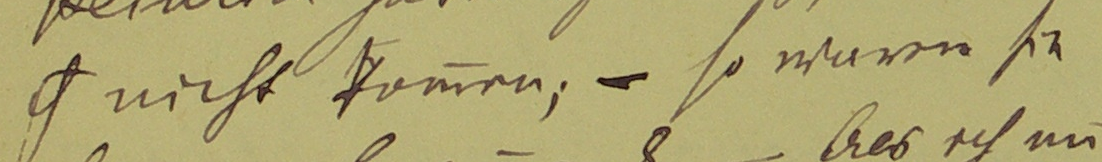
auch nicht kommen;- So waren sie
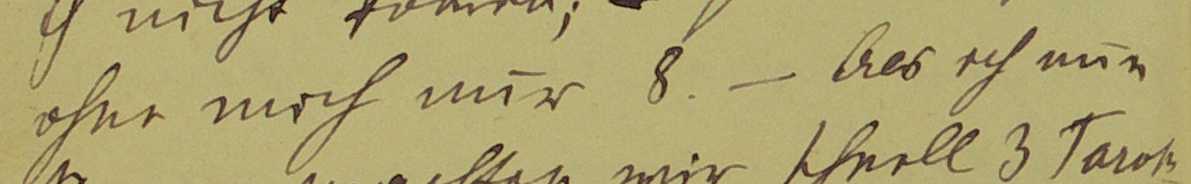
ohne mich nur 8,- Als ich nun
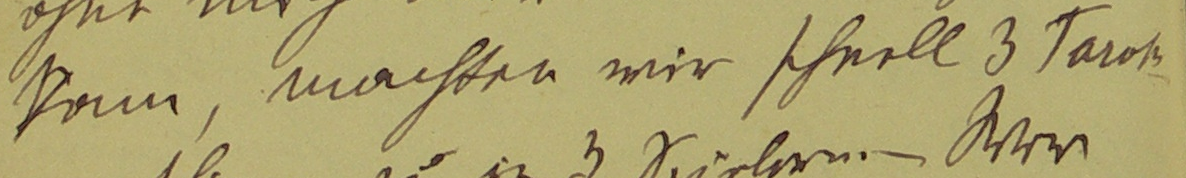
kam, machten wir schnell 3 Tarok¬
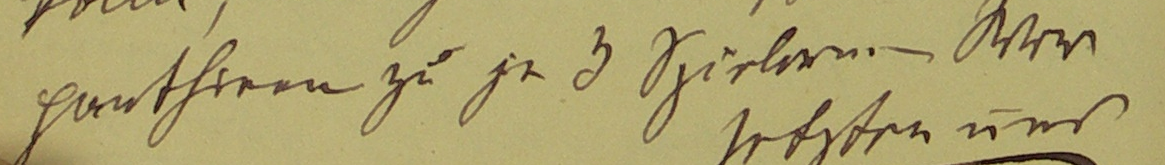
parthien zu je 3 Spielern.- Wir
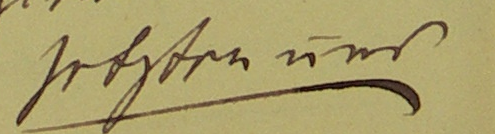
setzen uns
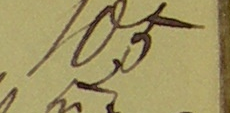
105
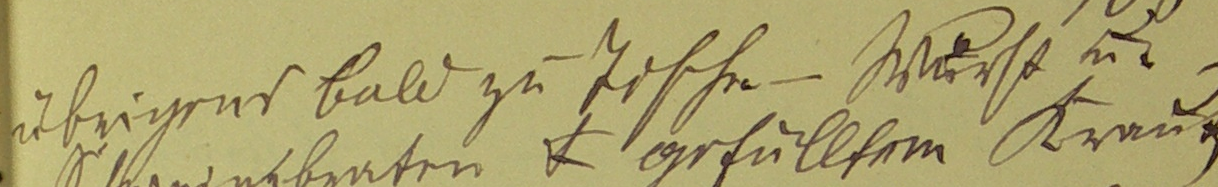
übrigens bald zu Tisch,- Wurst und
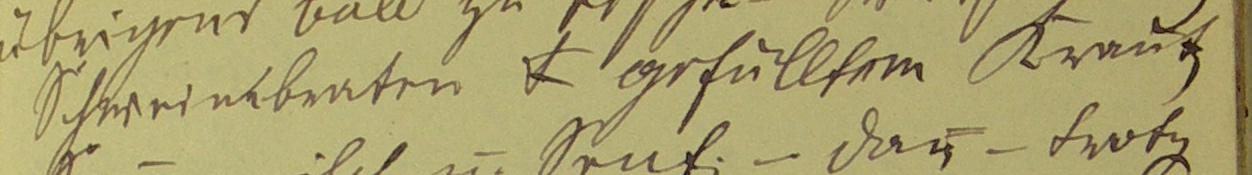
Schwebraten mit gefüllten Kraut,
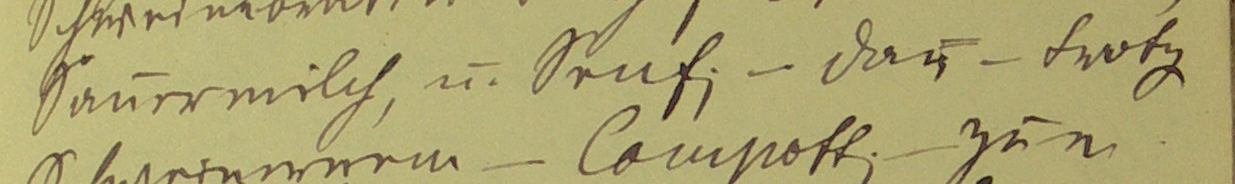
Sauermilch und Senf. Dann- trotz
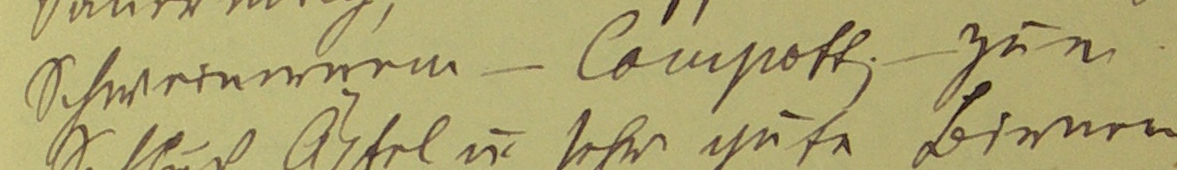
Schweinereien- Compott;- dazu
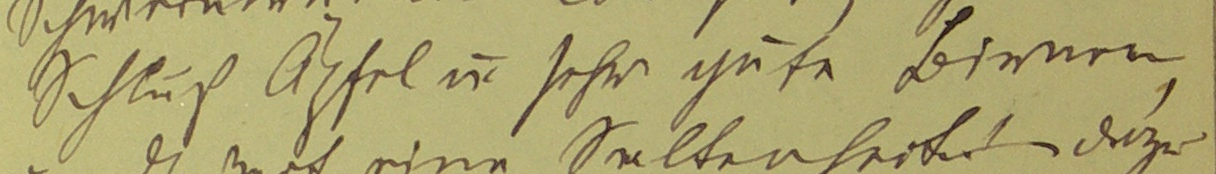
Äpfel und sehr gute Birnen,
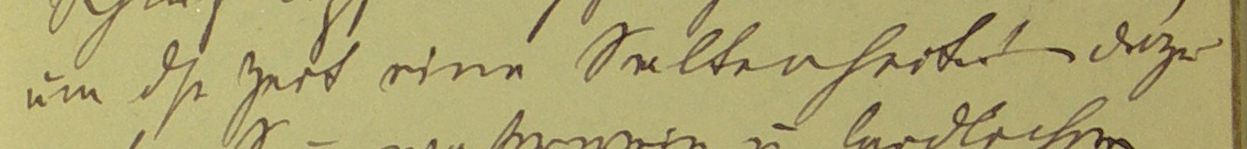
um diese Zeit eine Seltenheit, dazu
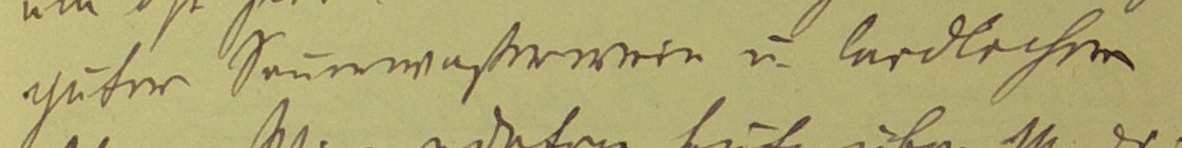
guter Sommerweißwein und leidlicher
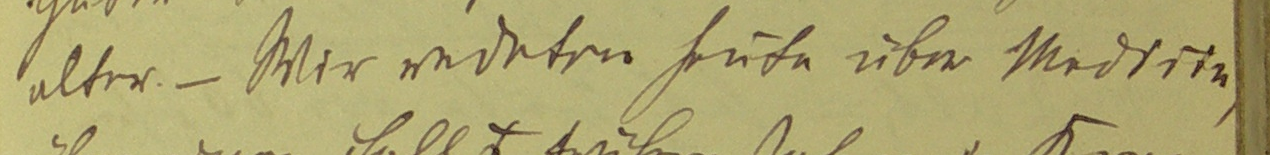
alter.- Wir redeten heute über Medizin,
